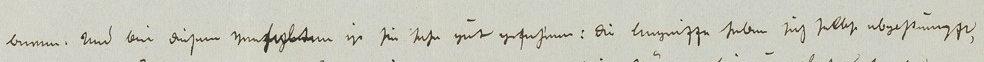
waren. Und bei diesem Verhalten ist sie sehr gut gefahren: Die Angriffe haben sich selbst abgestumpft,
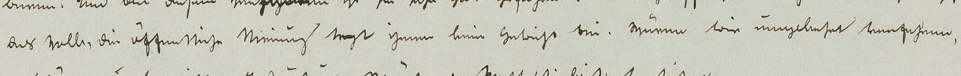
das Volk, die öffentliche Meinung legt ihnen kein Gewicht bei. Wären wir umgekehrt verfahren,
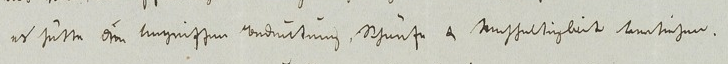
es hätte den Angriffen Bedeutung, Schärfe & Nachhaltigkeit verliehen.
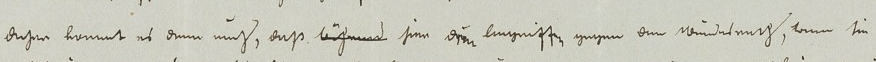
Daher kommt es denn auch, daß Hemd hier den Angriffen gegen den Bundesrath, wenn sie
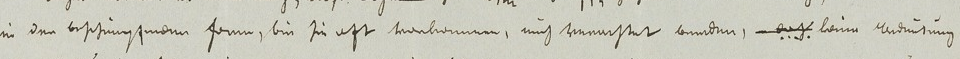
in der beschimpfenden Form, wie sie oft vorkommen, auch verachtet werden, doch keine Bedeutung
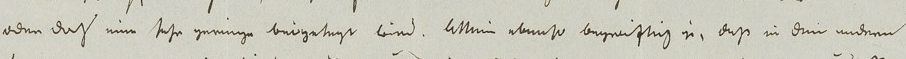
oder doch eine sehr geringe beigelegt wird. Allein ebenso begreiflich ist, daß in den andern
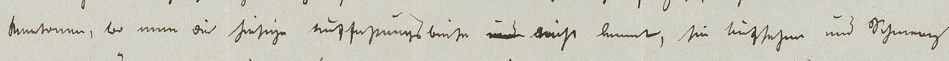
Kantonen, wo man die hiesige Auffaßungsweise und nicht kennt, sie Aufsehen und Schmerz
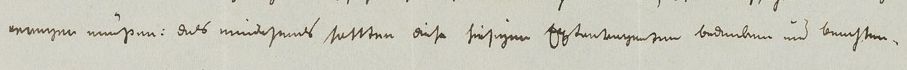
erregen müßen: Das mindestens sollten diese hiesigen Extravaganten bedenken und beachten.
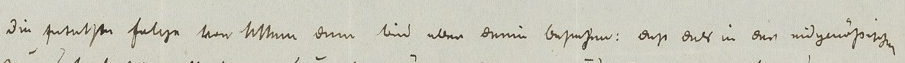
Die fatalste Folge von Allem dem wird aber darin bestehen: daß das in der eidgenößischen
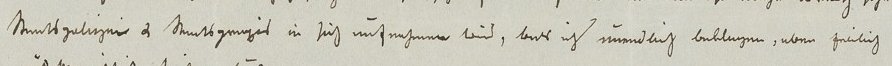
Staatspolizei & Staatspraxis in sich aufnehmen wird, was ich unendlich beklagen, aber freilich
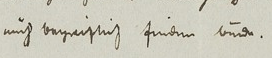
auch begreiflich finden würde.
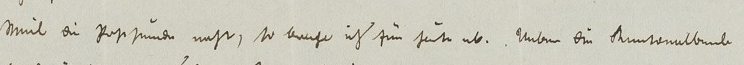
Weil die Poststunde naht, so breche ich für heute ab. Ueber die Kantonalbank
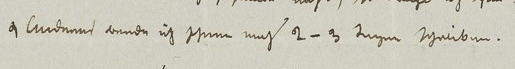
& Anderes werde ich Ihnen nach 2 – 3 Tagen schreiben.
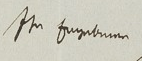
Ihr Ergebener
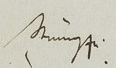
Stämpfli.
